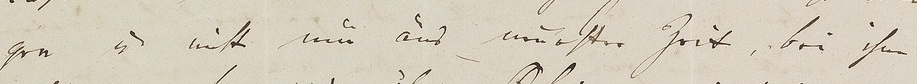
gen u. nicht nur aus neuester Zeit, bei ihm
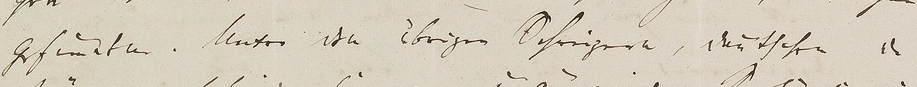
gefunden. Unter den übrigen Schweizern, Deutschen u.
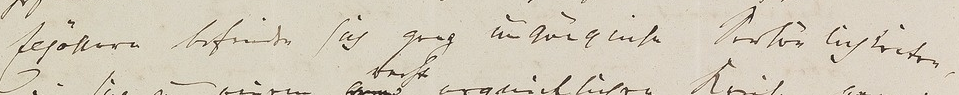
Elsässern befinden sich ganz umgängliche Persönlichkeiten,
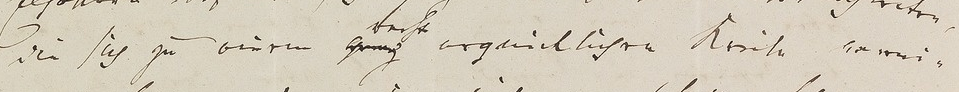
die sich zu einem ganzrecht erquicklichen Kreise verei-
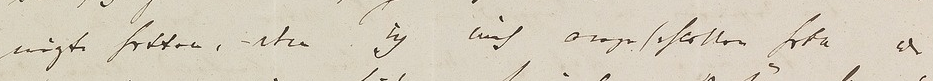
nigt hatten, dem ich mich angeschlossen habe u.
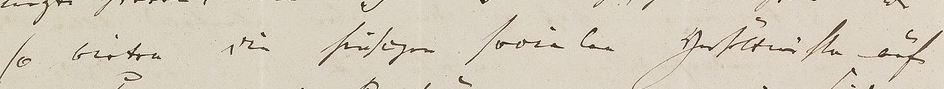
so bieten die hiesigen socialen Verhältnisse auf
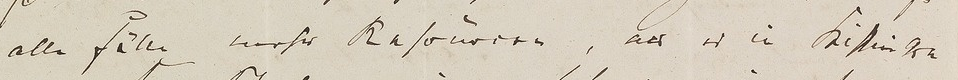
alle Fälle mehr Resourcen, als es in Kissingen
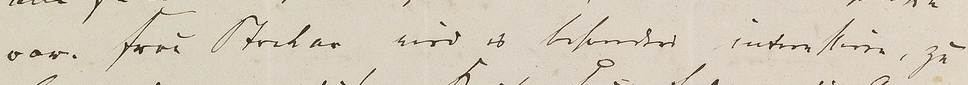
war. Frau Stockar wird es besonders interessiren, zu
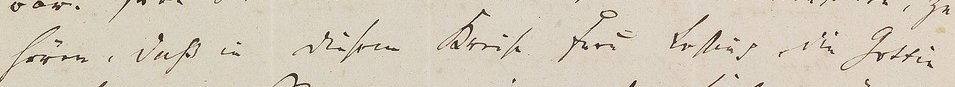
hören, daß in diesem Kreise Frau Lessing die Gattin
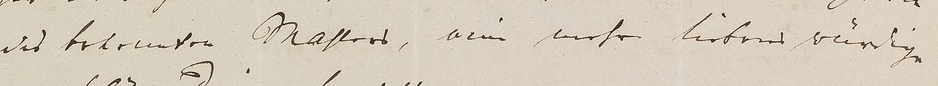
des bekannten Mahlers, eine mehr liebenswürdige
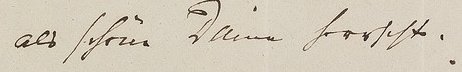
als schöne Dame herrscht.
